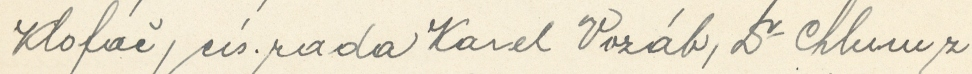Klofáč, cís. rada Karel Vozáb, Dr Chlum z
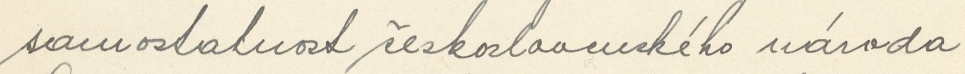samostatnost československého národa.
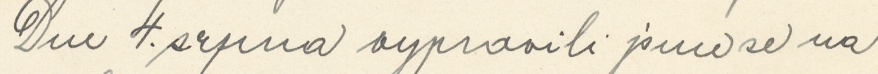Dne 4. srpna vypravili jsme se na
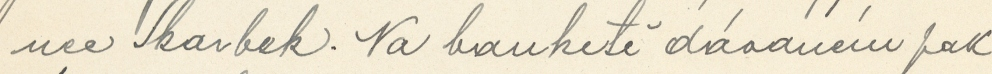nec Skarbek. Na banketě dávaném pak
